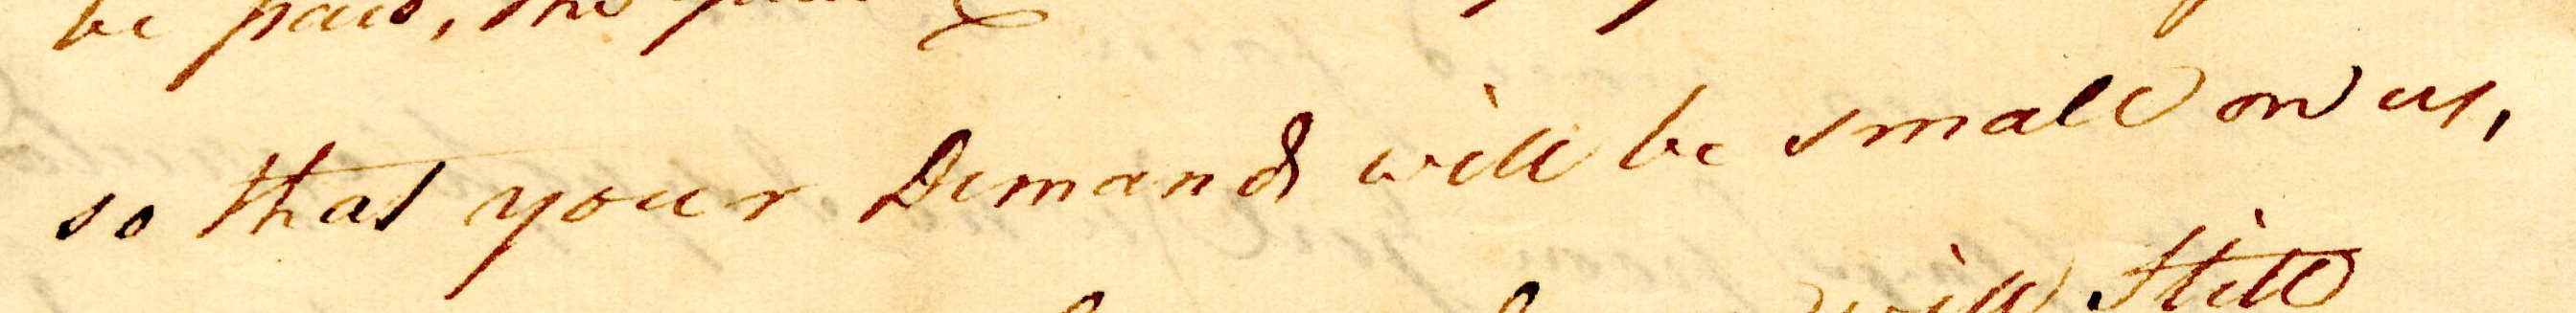so that your Demand will be small on us,
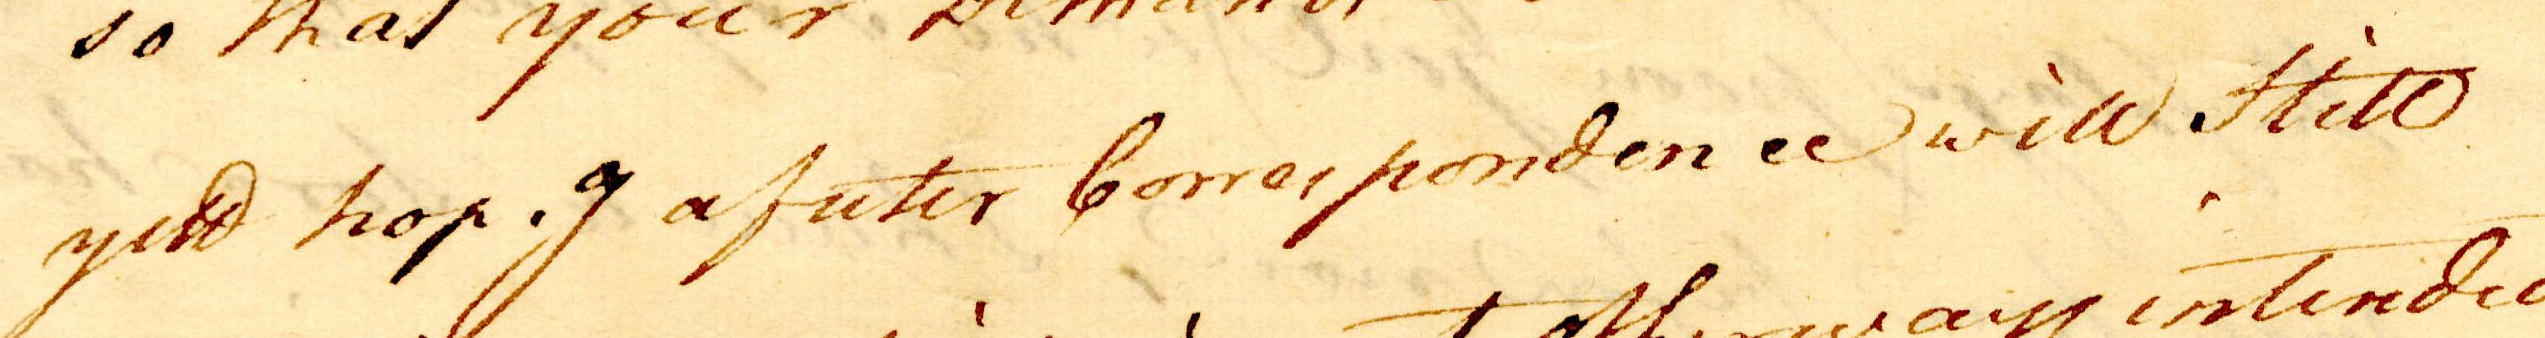youd hop.^g a futer Correspondence will still
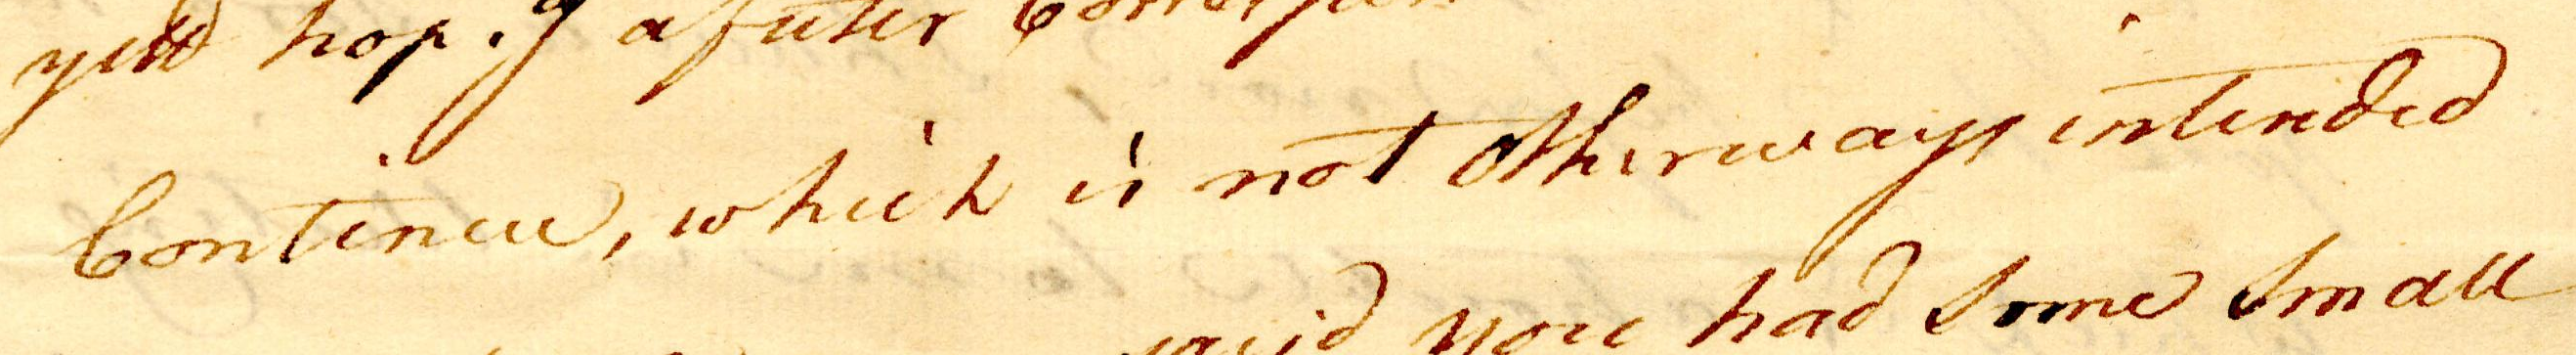Continue, which is not otherways intended
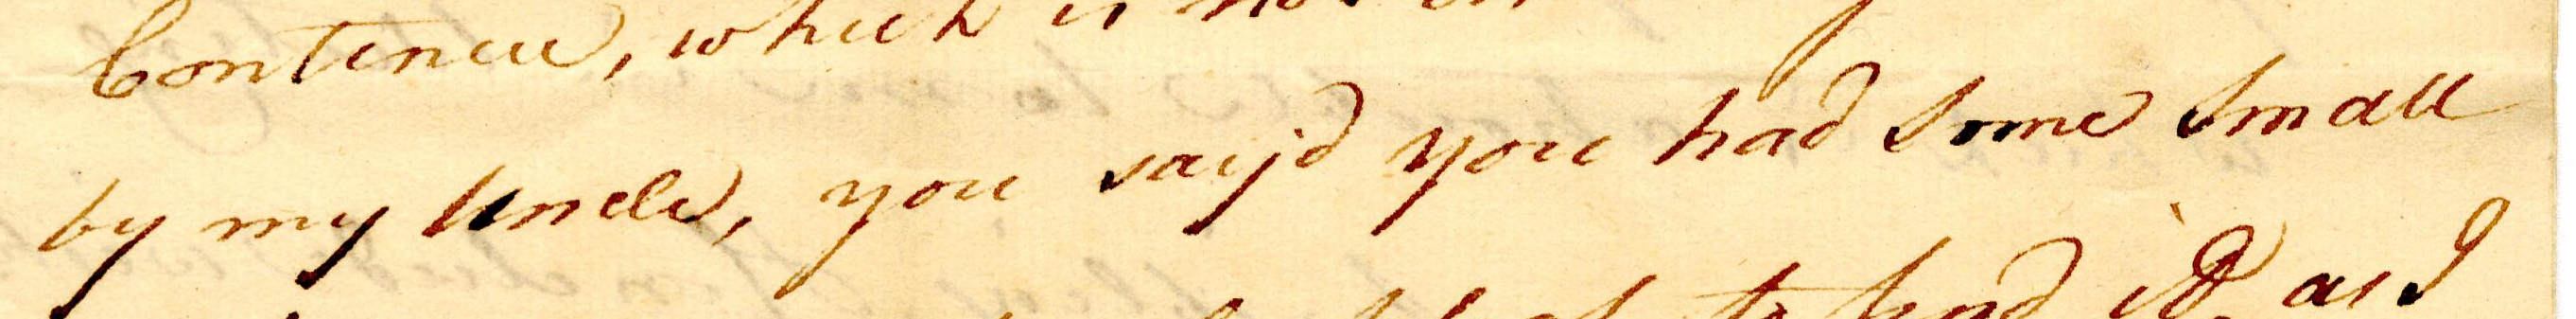by my Uncle, you say'd you had some Small
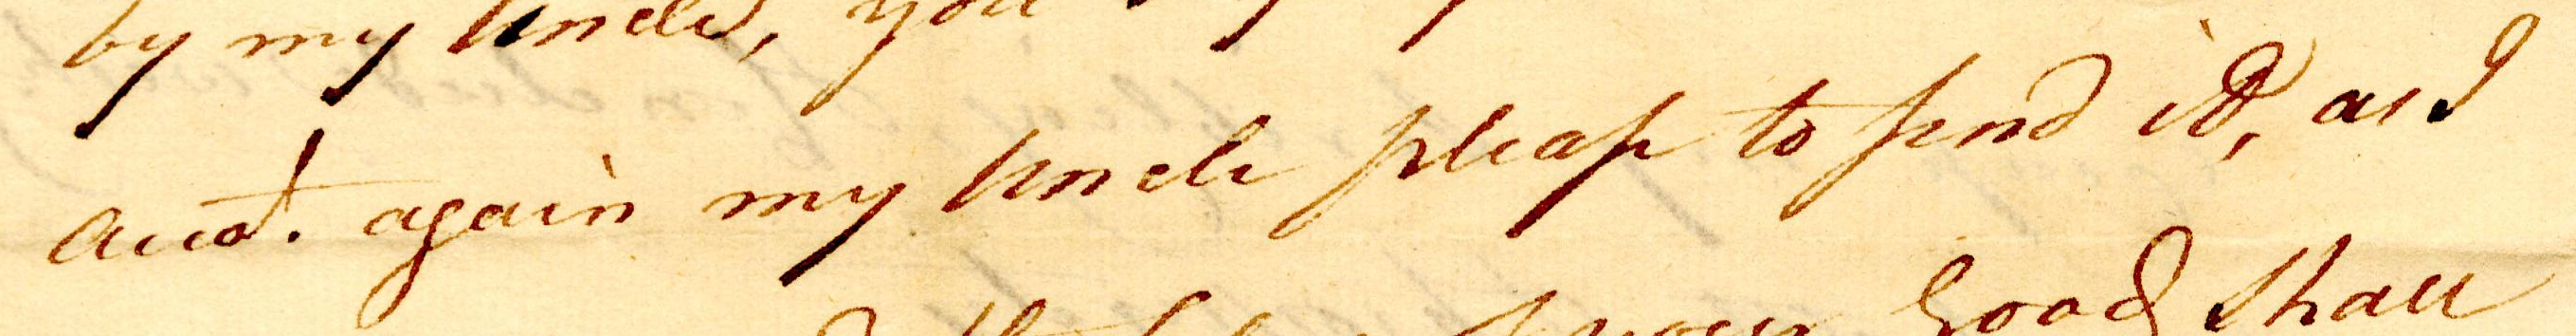Acco^t. again my Uncle please to send it, and
